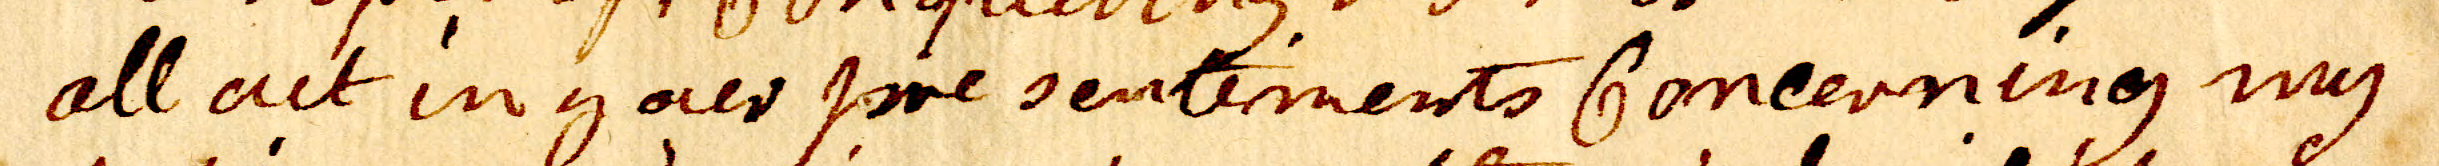all out in your fine sentiments Concerning my
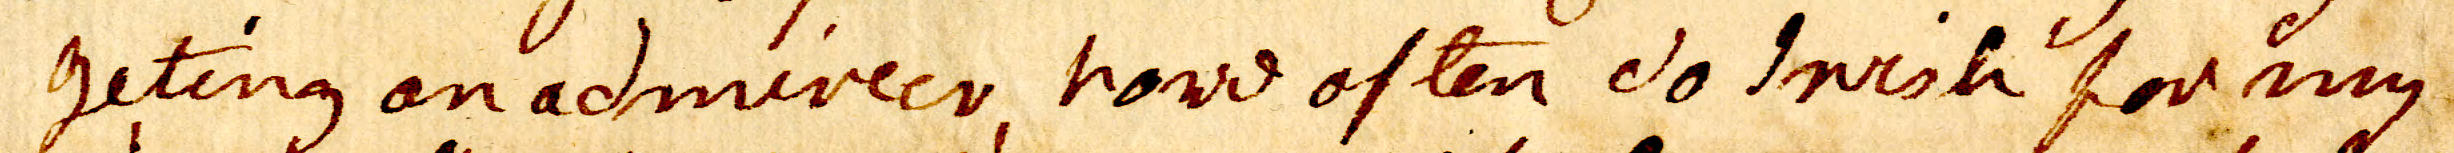geting an admireer, how often do I wish for my
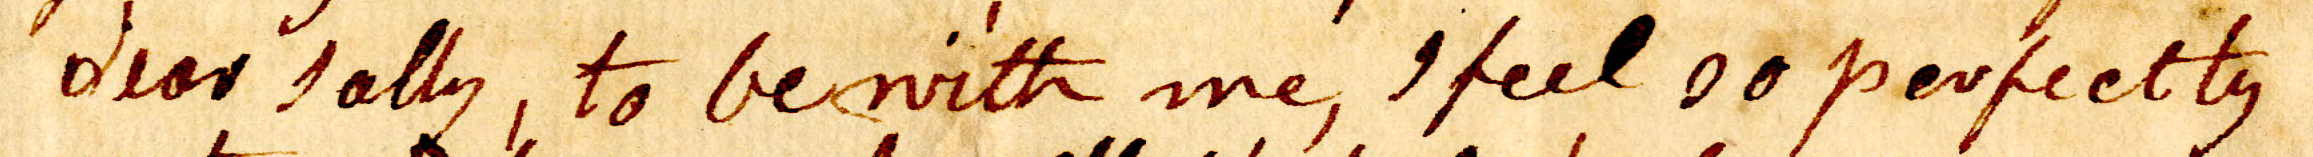dear sally to be with me, I feel so perfectly
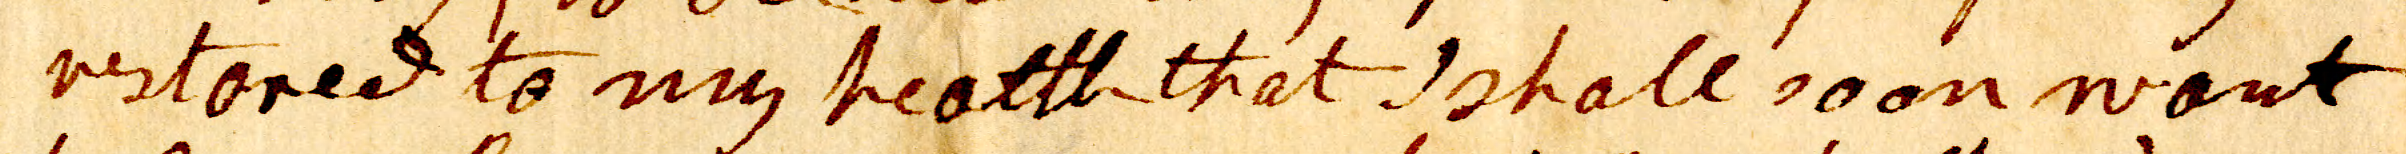restored to my health that I shall soon want
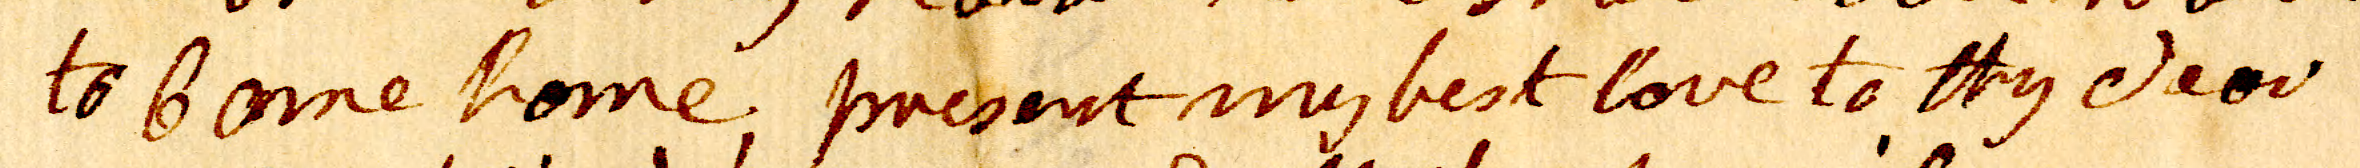to Come home, present my best love to thy dear
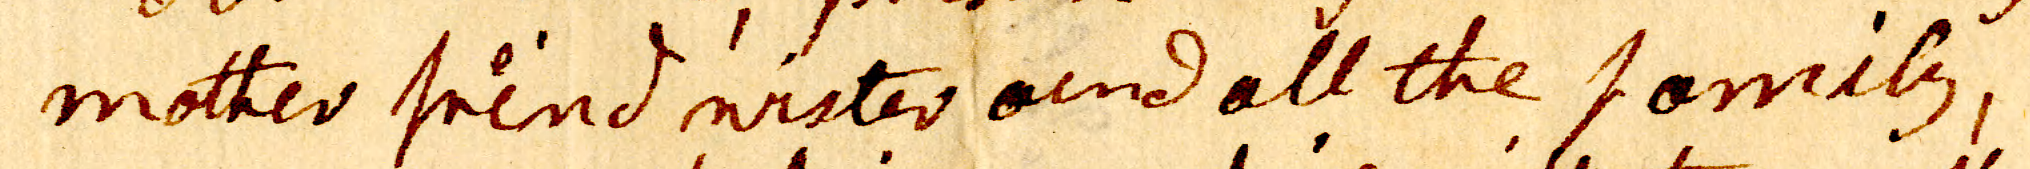mother friend wister and all the the family,
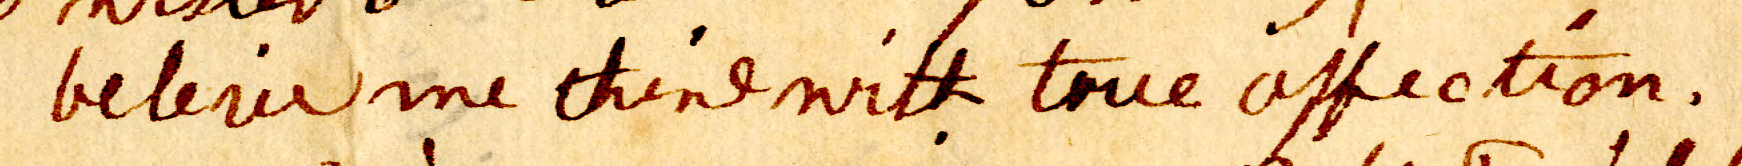believe me thine with true affection,
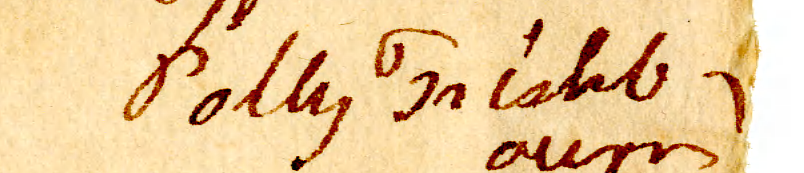Polly Fishb-
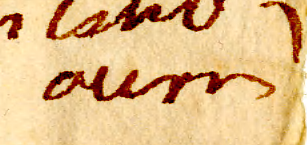ourn
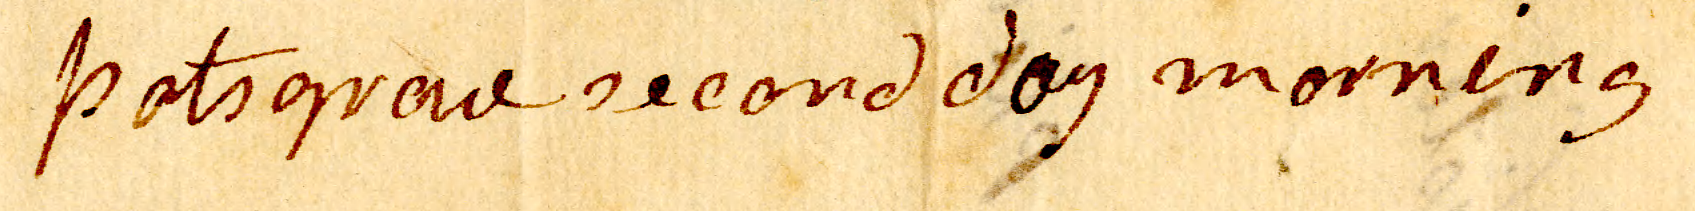potsgrove second day morning
